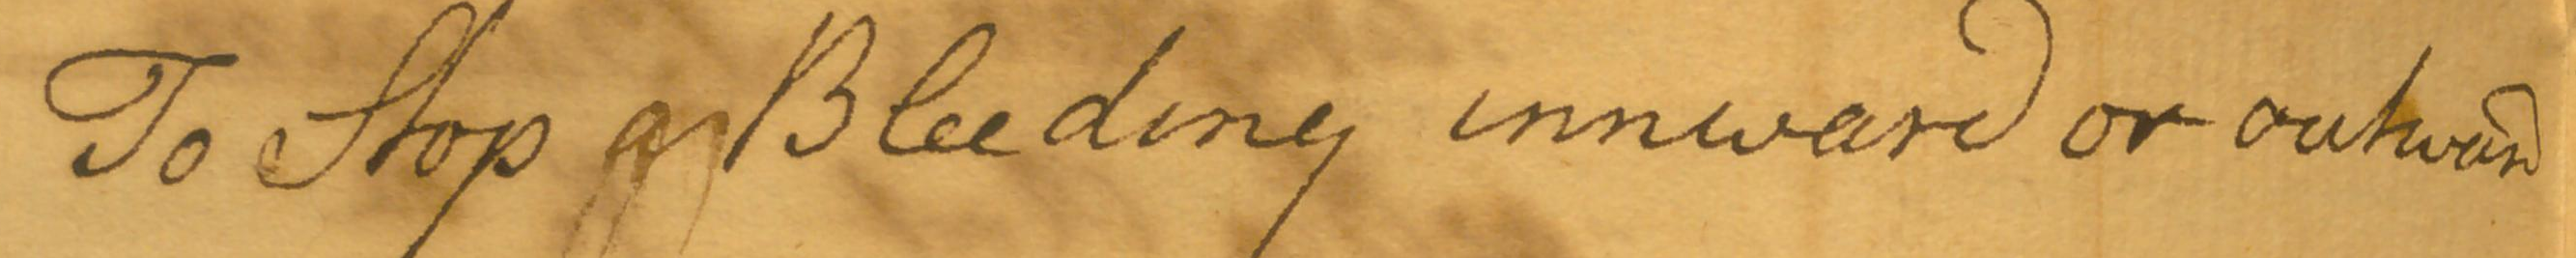To Stop a Bleeding innward or outward
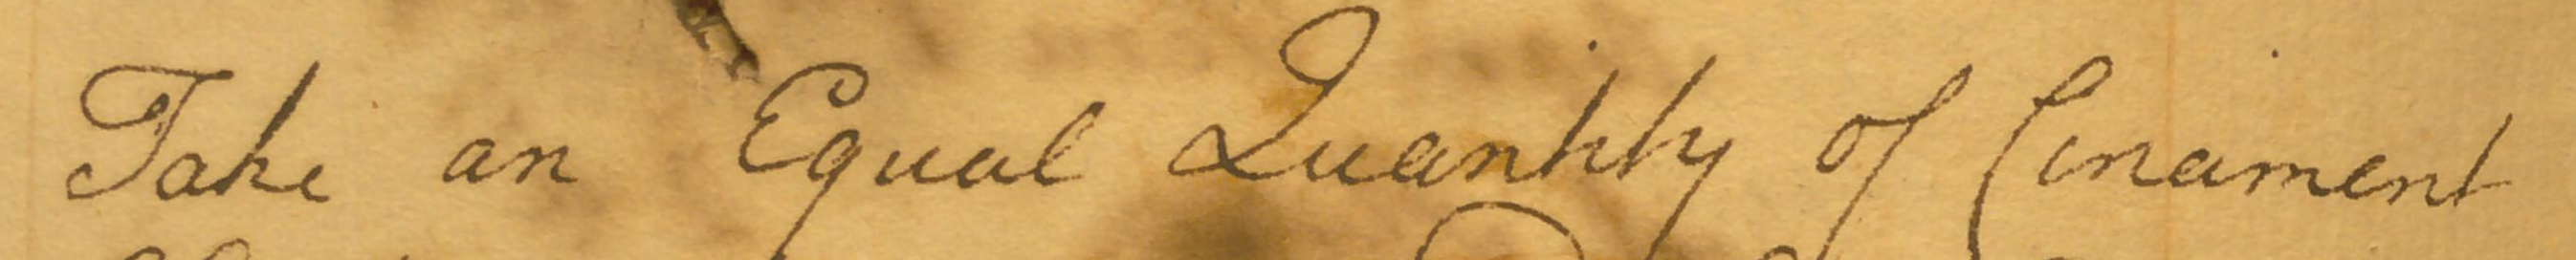Take an Equal Quantity of Cinament
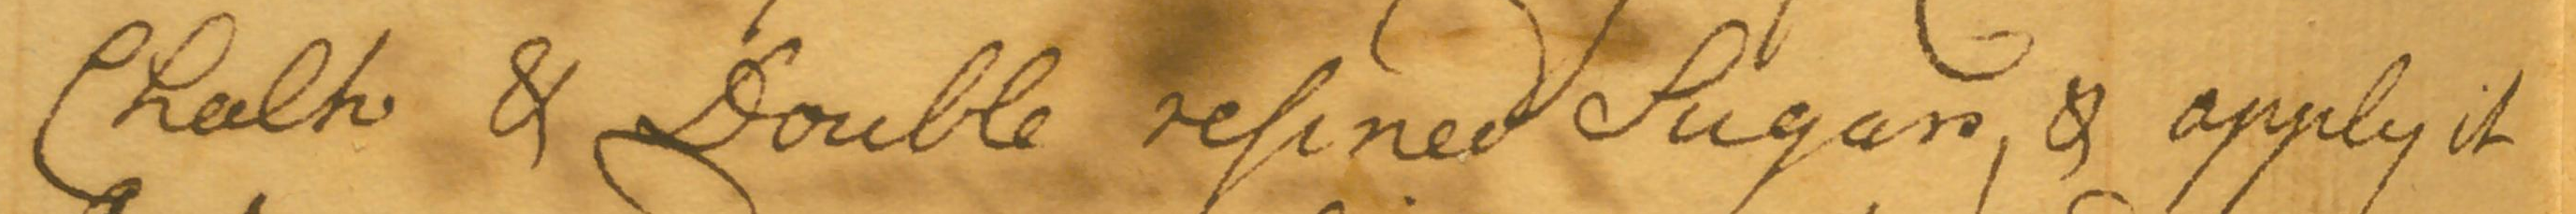Chalk & Double refined Sugar, & apply it
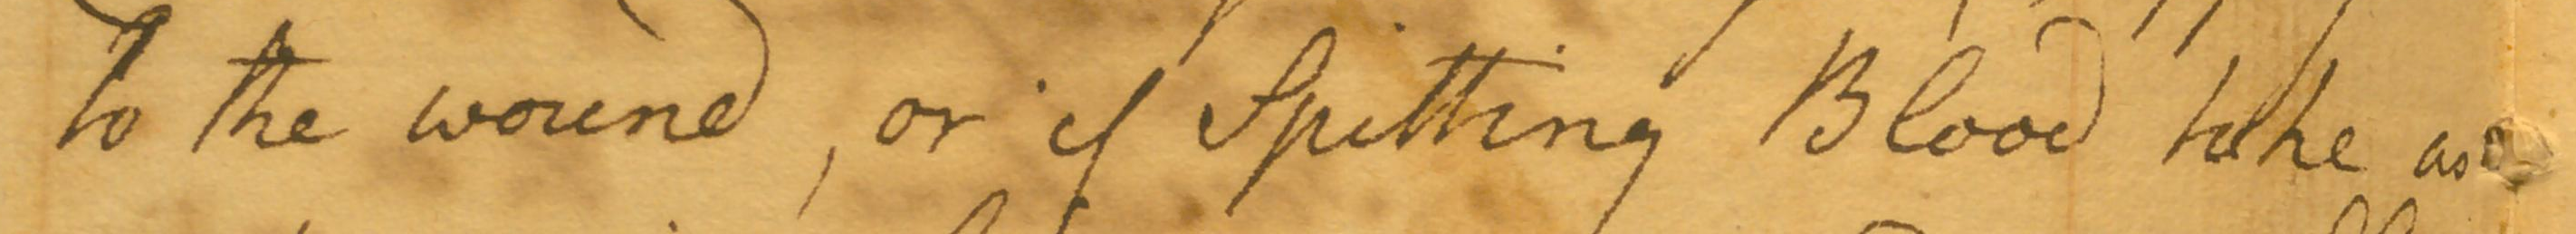to the wound, or if Spitting Blood take as
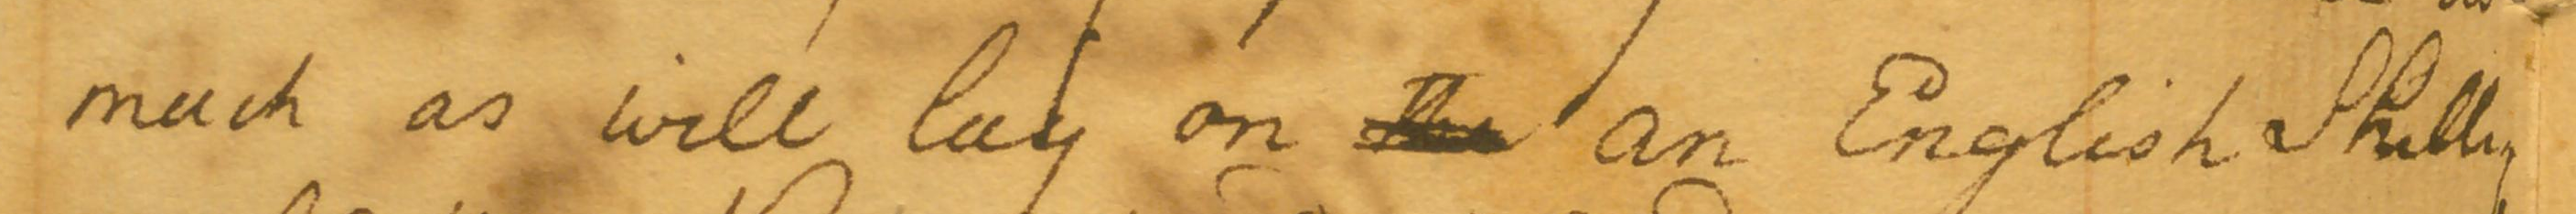much as will lay on [___] an English Shilling
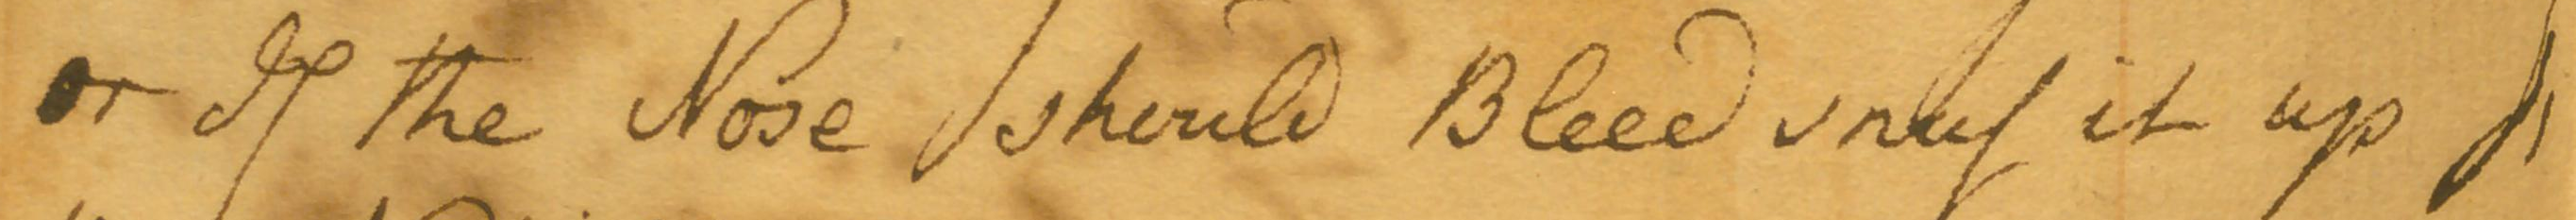or If the Nose should Bleed snuf it up
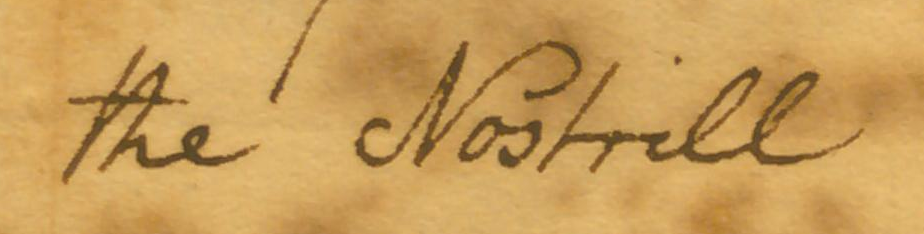the Nostrill
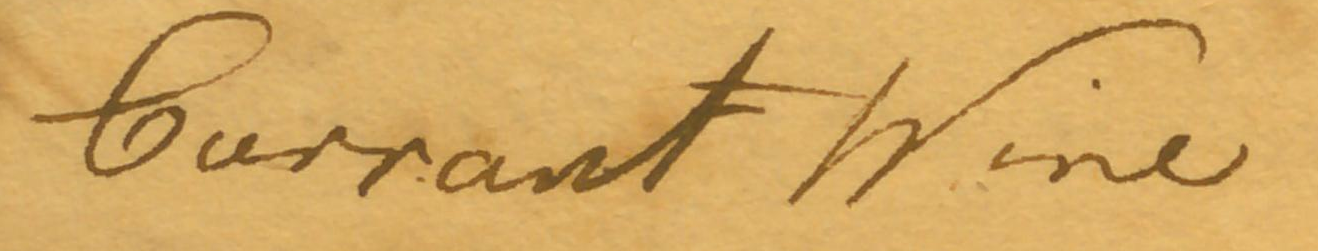Currant Wine
